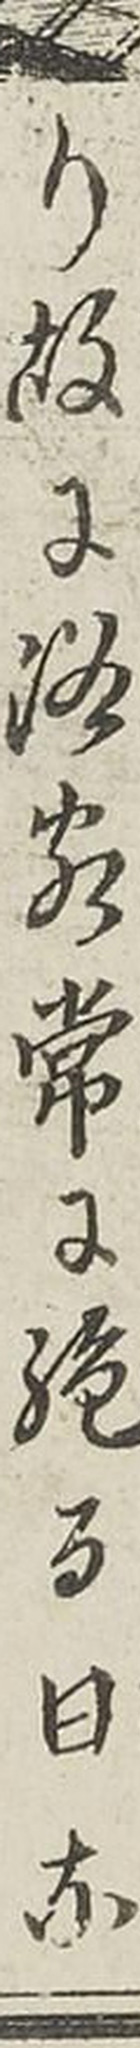り故に浴客常に絶る日な
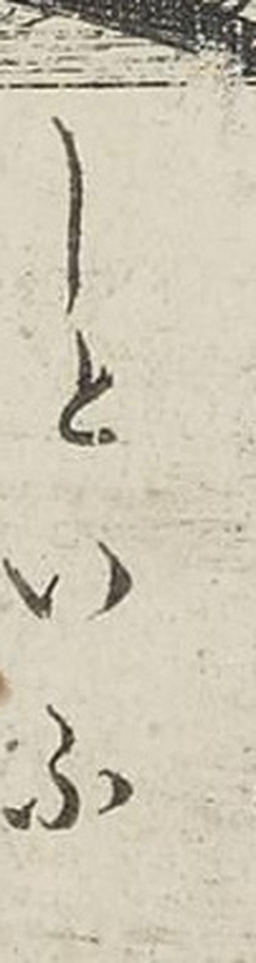しといふ
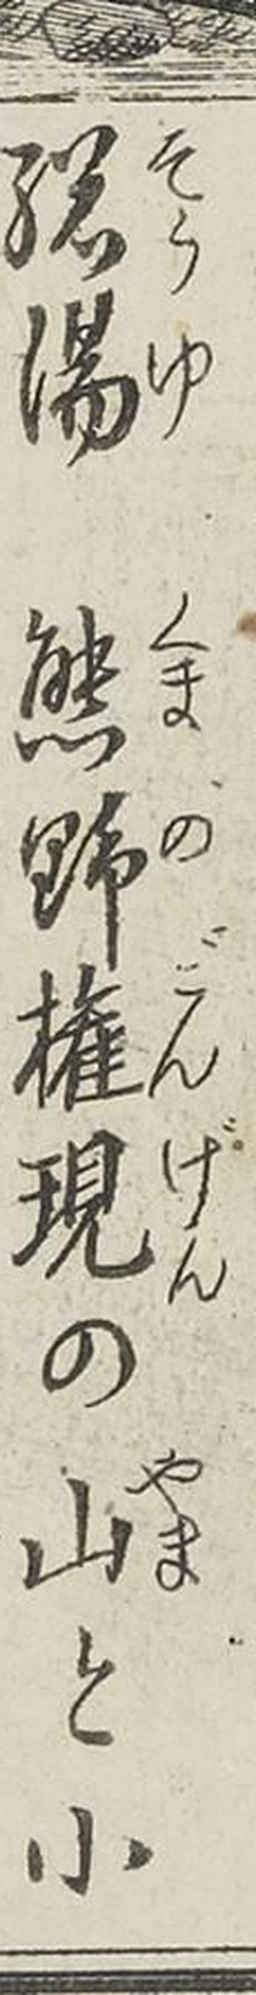総湯熊野権現の山と小
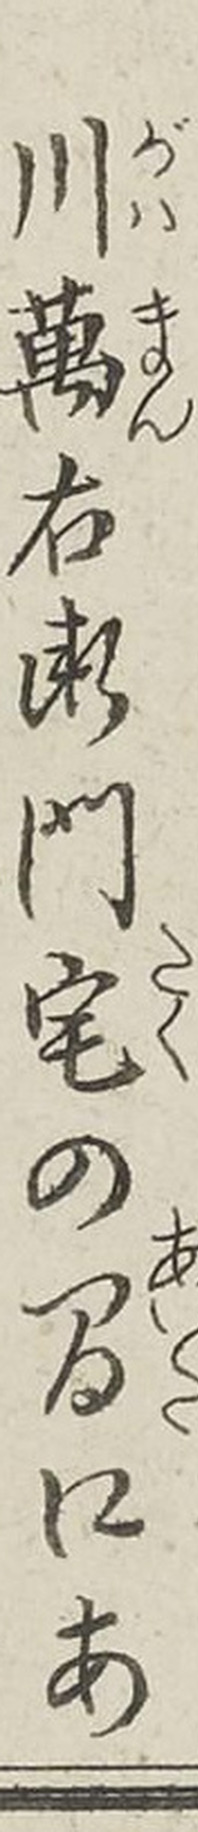川萬右衛門宅の間にあ
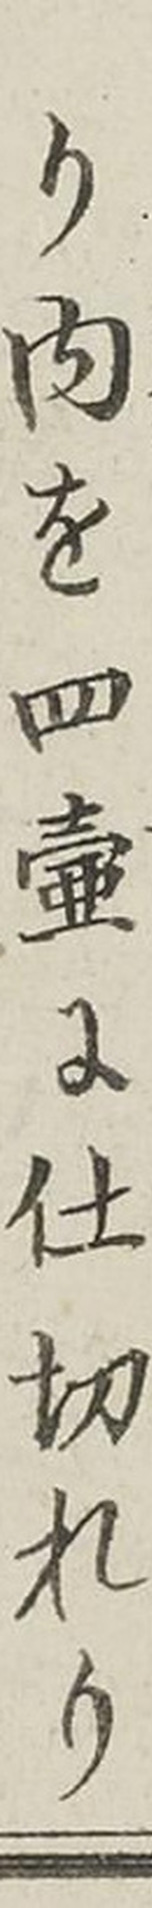り内を四壷に仕切れり
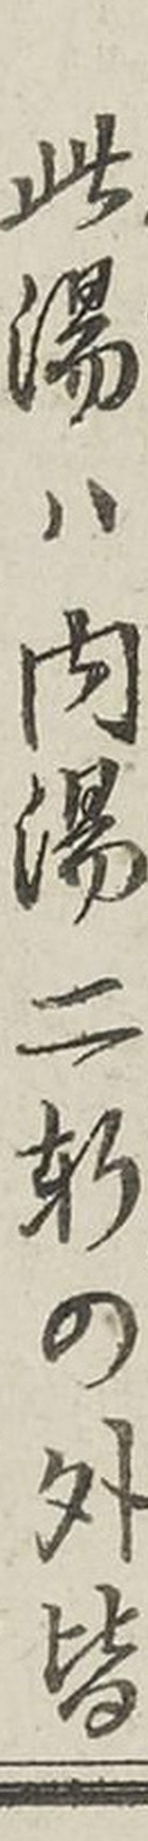此湯は内湯二軒の外皆
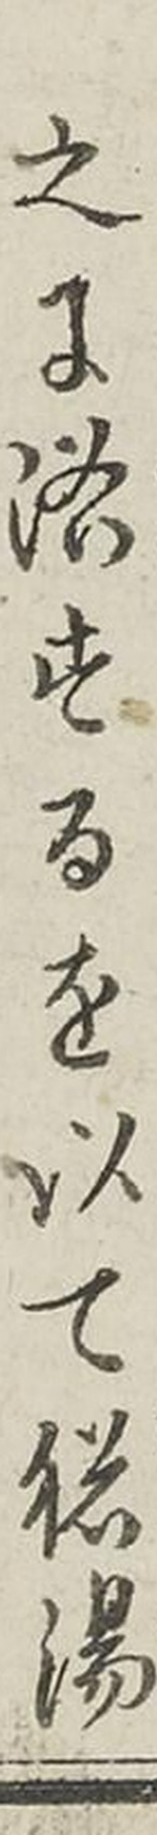之に浴するを以て総湯
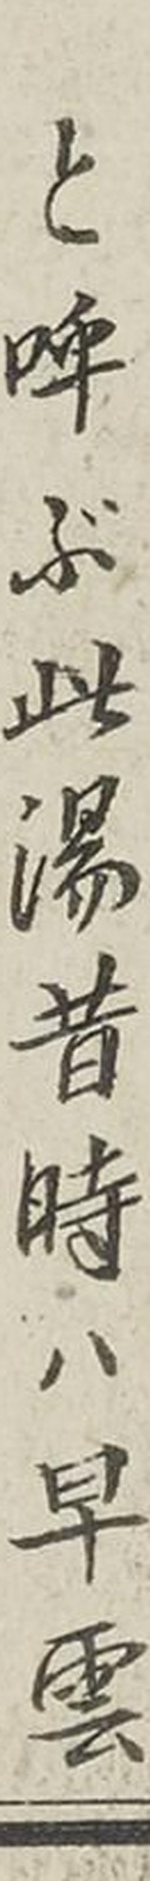と呼ぶ此湯昔時は早雲
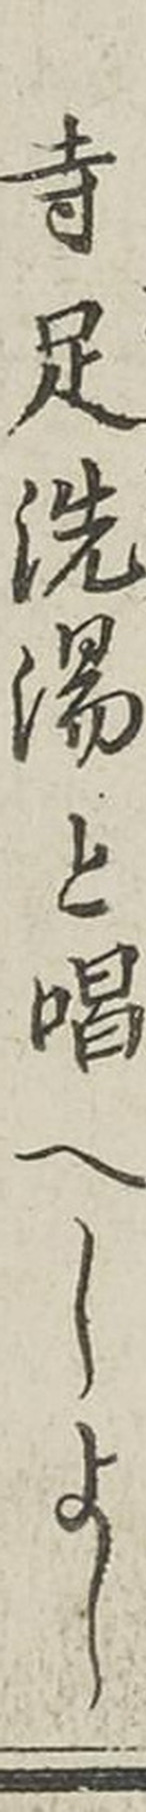寺足洗湯と唱へしよし

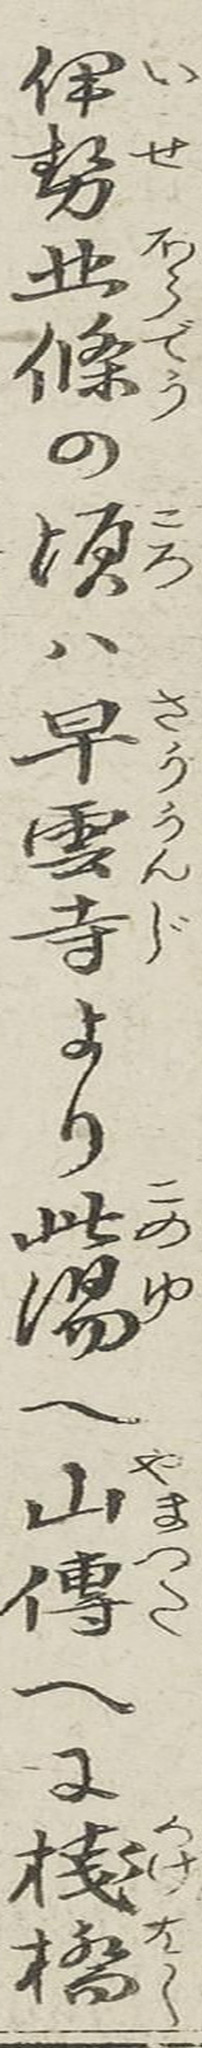伊勢北條の頃は早雲寺より此湯へ山伝へに桟橋
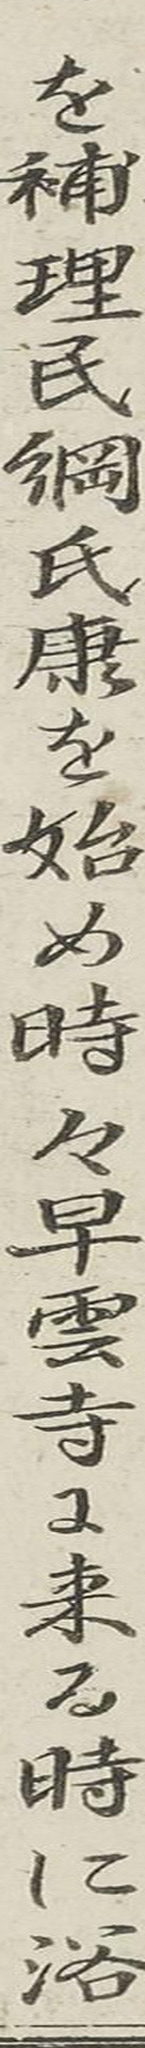を補理民綱氏康を始め時々早雲寺に来る時に浴
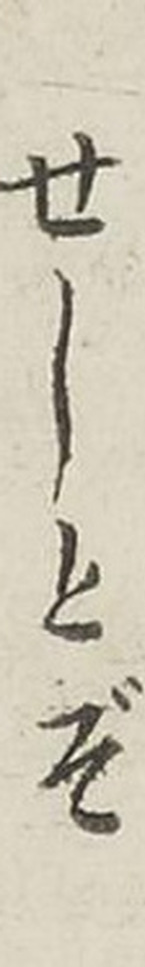せしとぞ
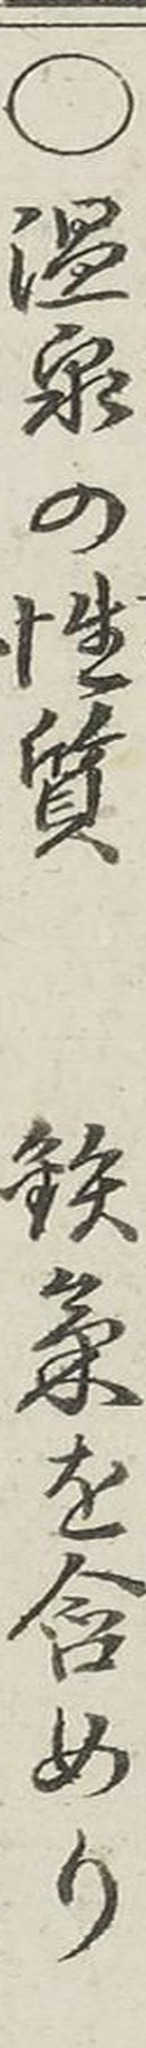○温泉の性質鉄気を含めり
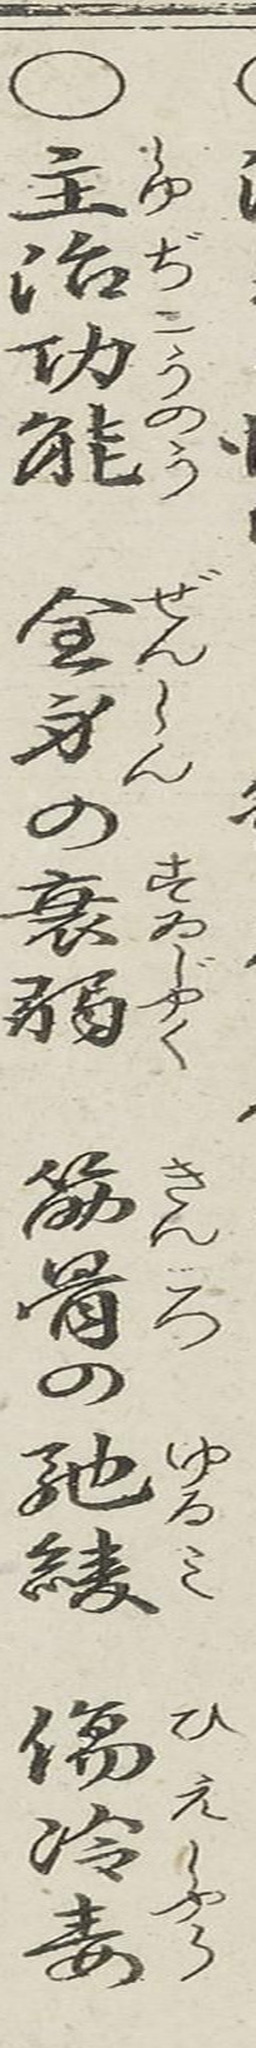○主治功能全身の衰弱筋骨の弛緩傷冷毒
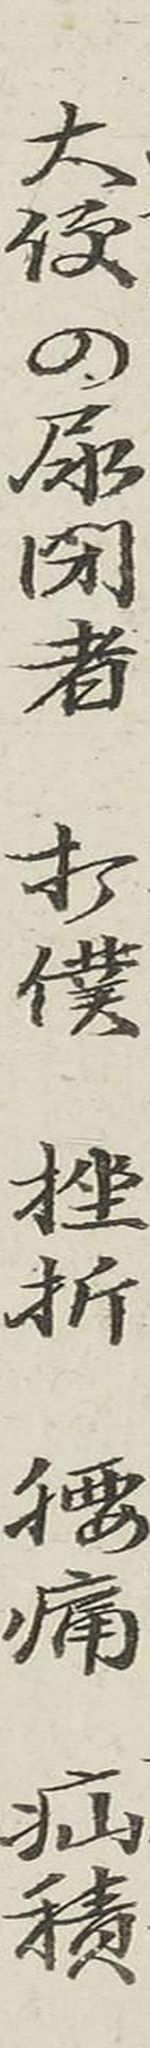大便の尿閉者打撲挫折腰痛疝積
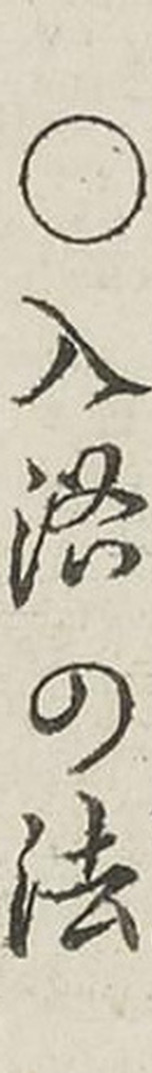〇入浴の法
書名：箱根温泉誌　全
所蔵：東京大学地震研究所図書室 Earthquake Research Institute Library, The University of Tokyo, JAPAN
